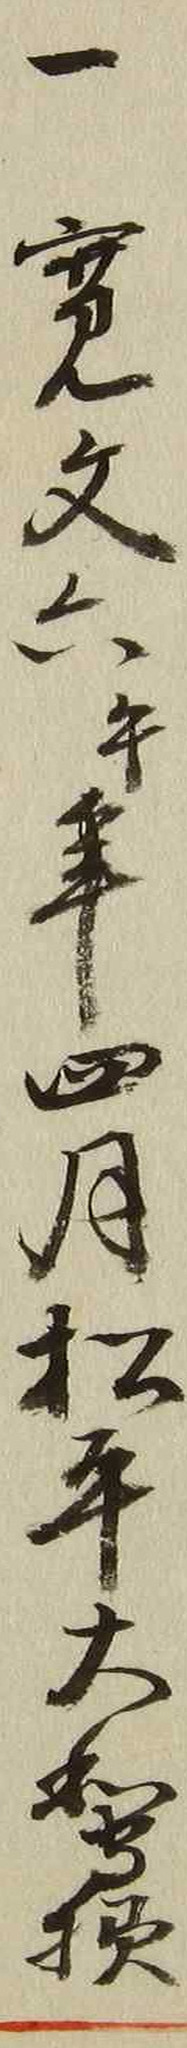一寛文六午年四月松平大和守様
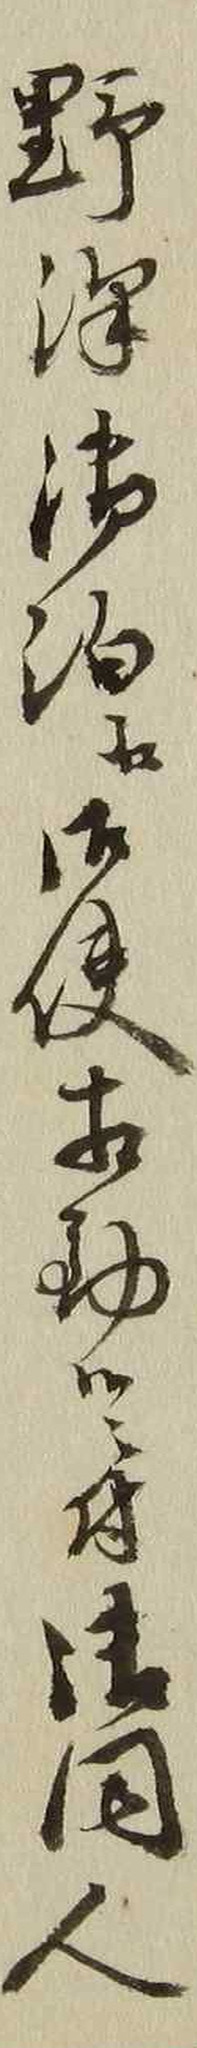野沢御泊江御使相勤候ニ付御同人
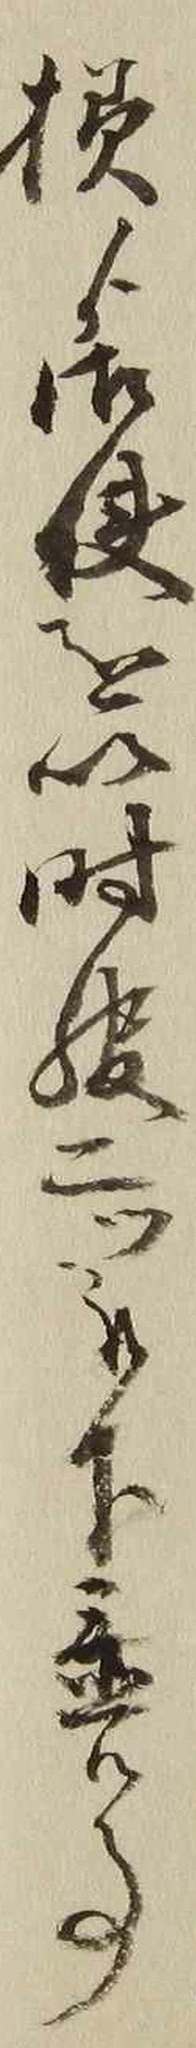様ゟ御使を以時服二ツ被下置候事
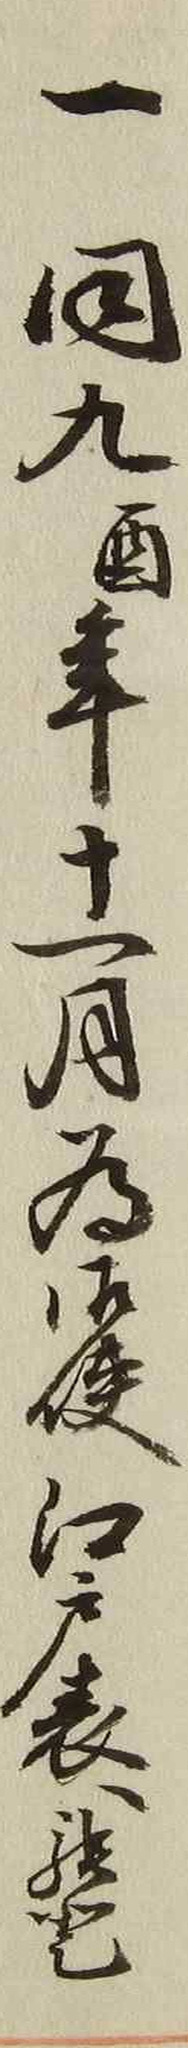一同九酉年十一月為御使江戸表へ罷登
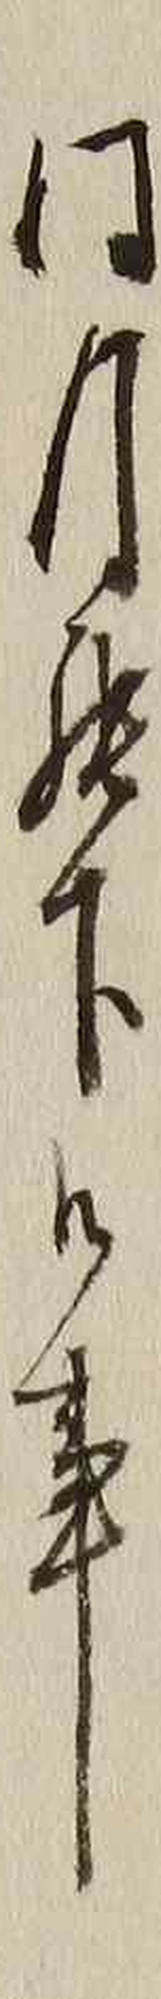同月罷下候事
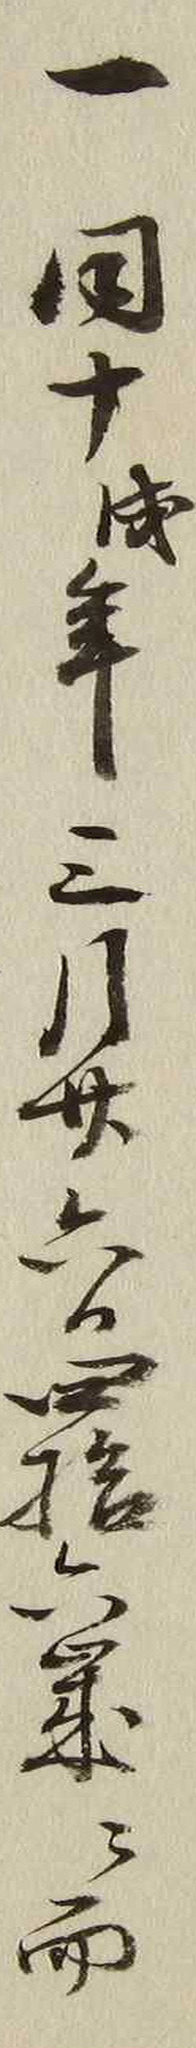一同十戌年三月廿六日四拾六歳ニ而
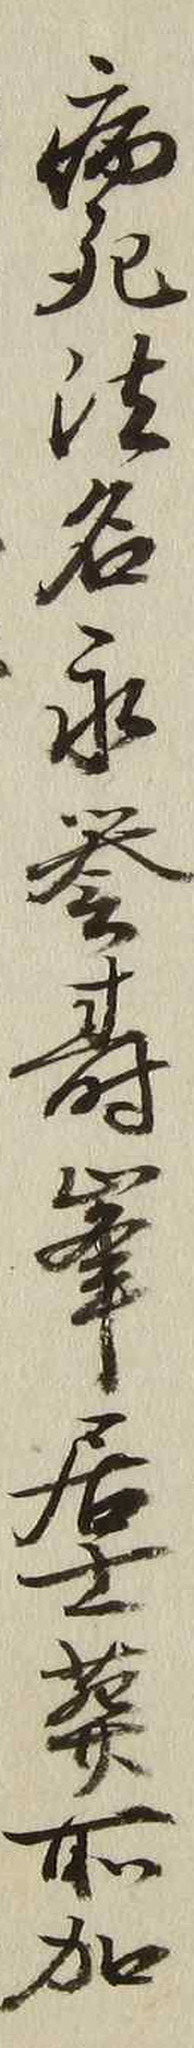病死法名永誉寿峰居士葬所加
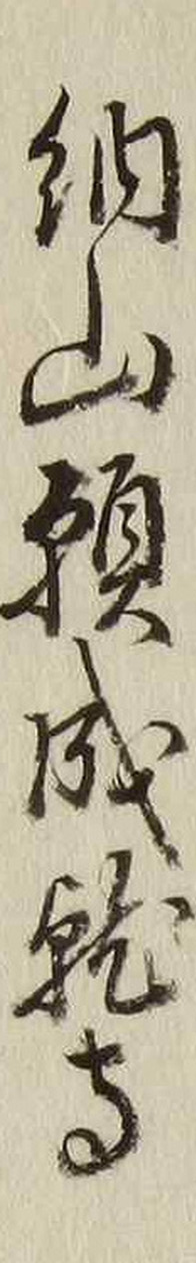納山願成就寺
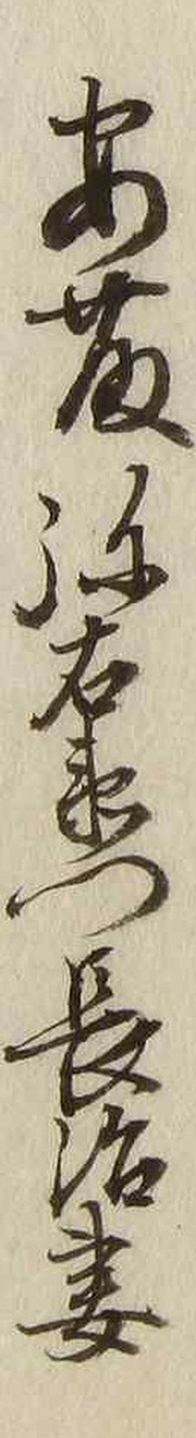女安藤弥右衛門長冶妻
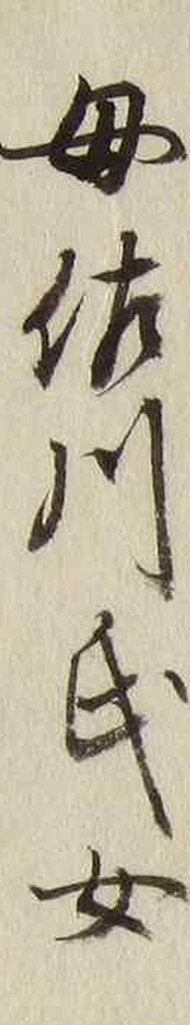母佐川氏女

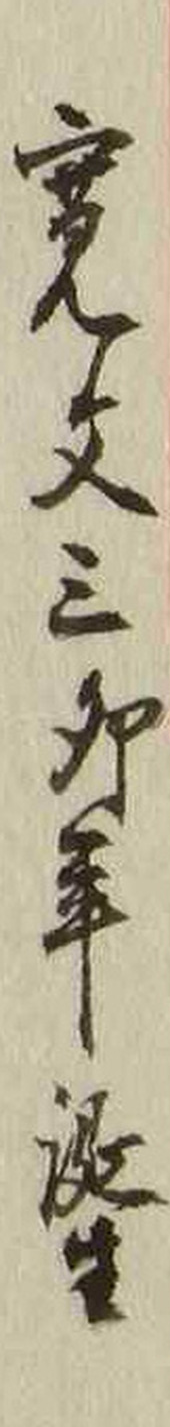寛文三卯年誕生
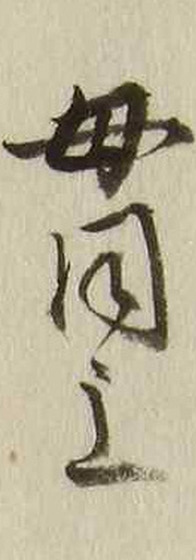母同上
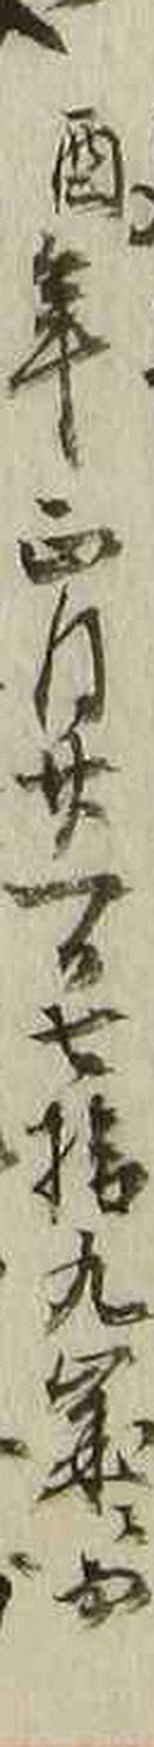酉年正月廿一日七拾九歳ニ而
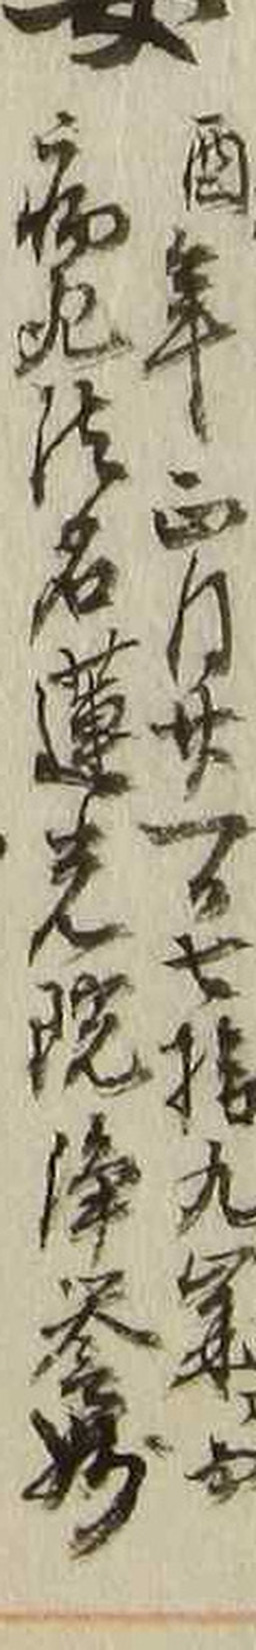病死法名蓮光院浄誉妙
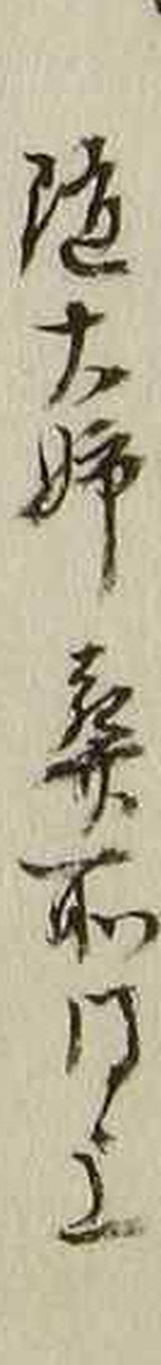随大姉葬所同上
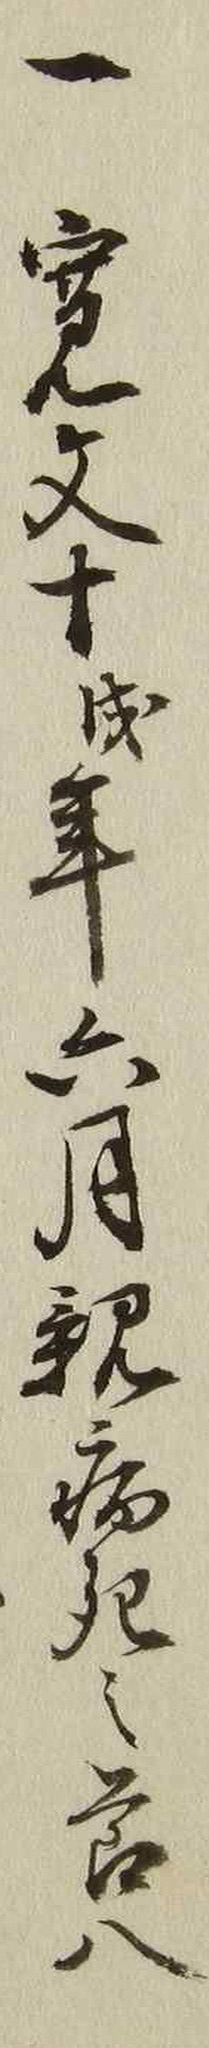一寛文十戌年六月親病死之節八
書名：諸士系譜　巻之23　い之部23
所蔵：会津若松市立会津図書館
